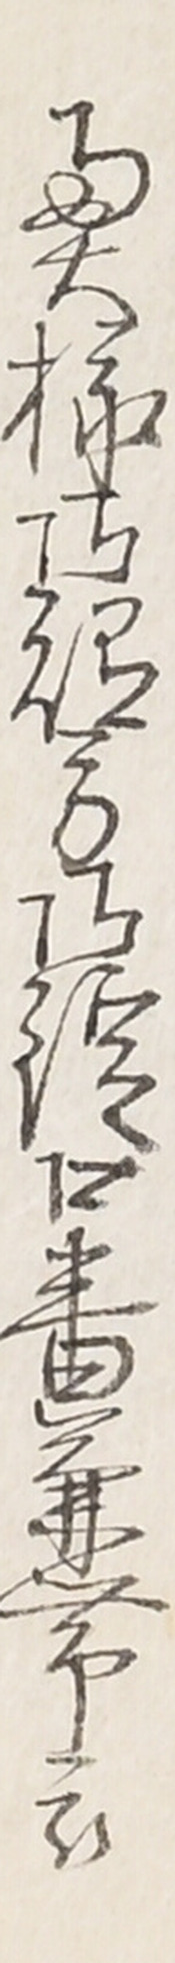奥様御賄方御錠口番兼帯被
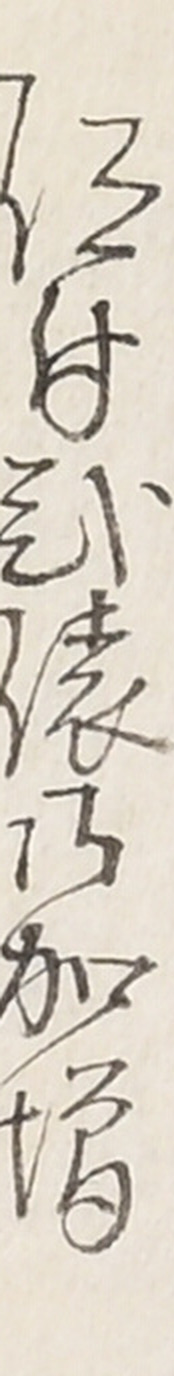仰付弐俵御加増
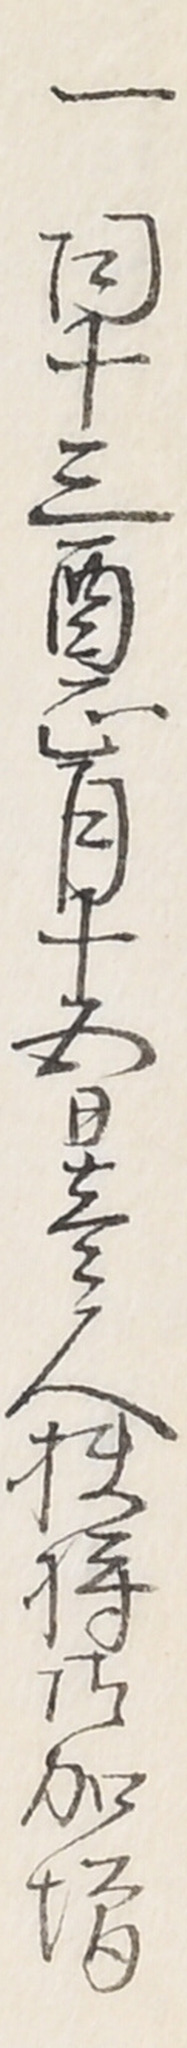一同十三酉正月十五日壱人扶持御加増
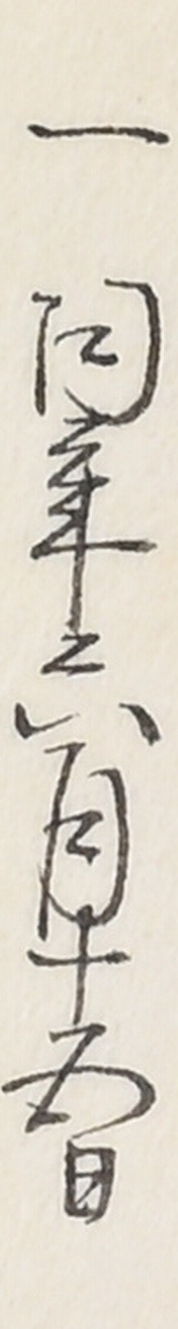一同年六月十五日
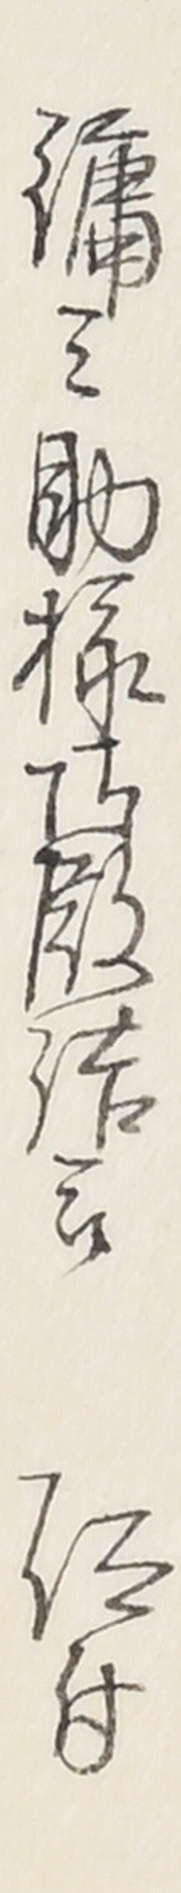鏞之助様御殿詰被仰付
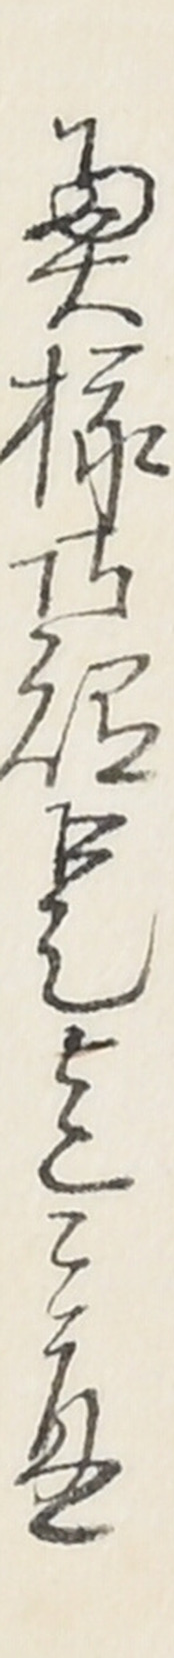奥様御賄是迄之通
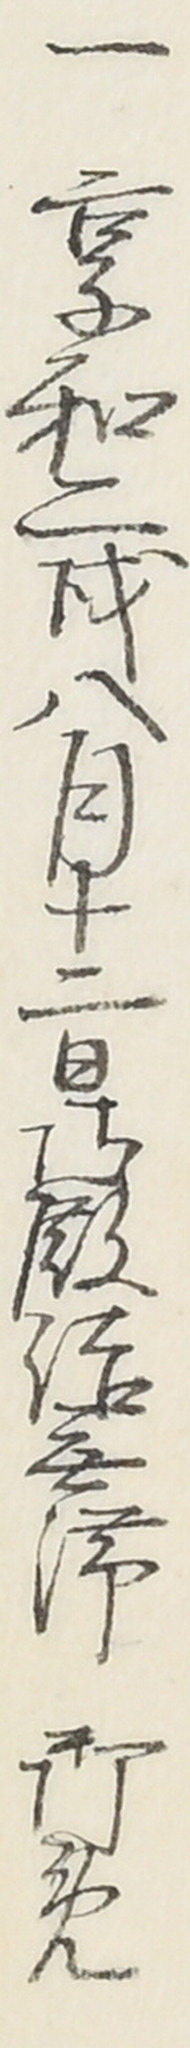一享和二戊八月十二日御殿詰無滞御免
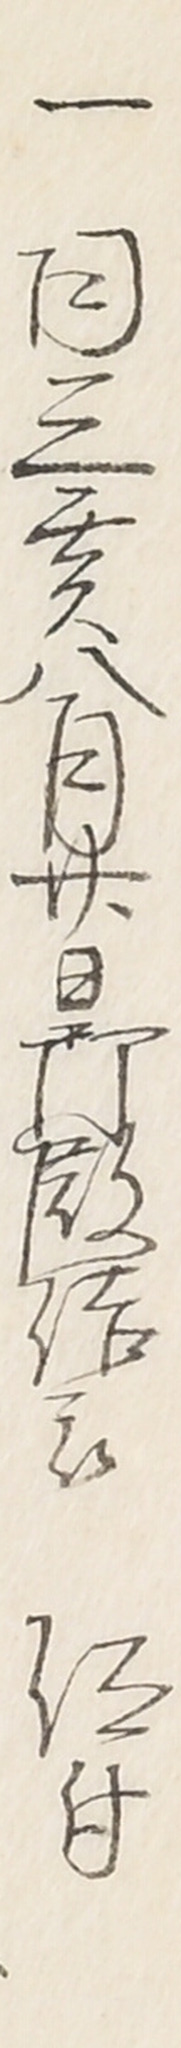一同三亥八月廿日御殿詰被仰付
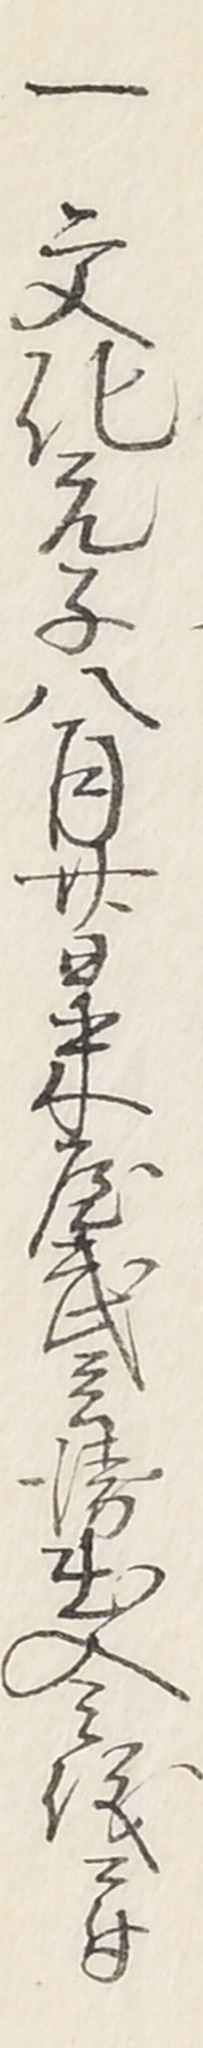一文化元子八月廿日米屋武兵衛出入之儀ニ付
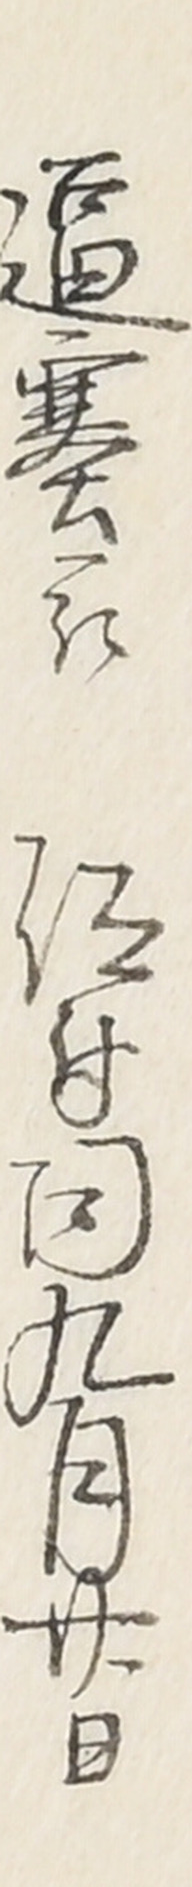逼塞被仰付同九月廿日
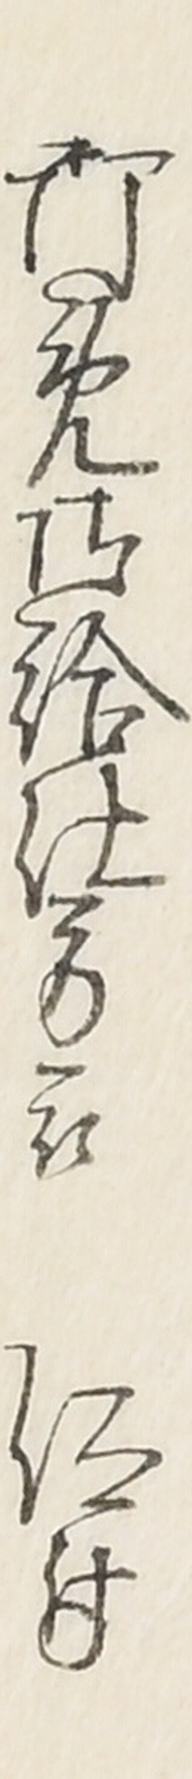御免御給仕方被仰付
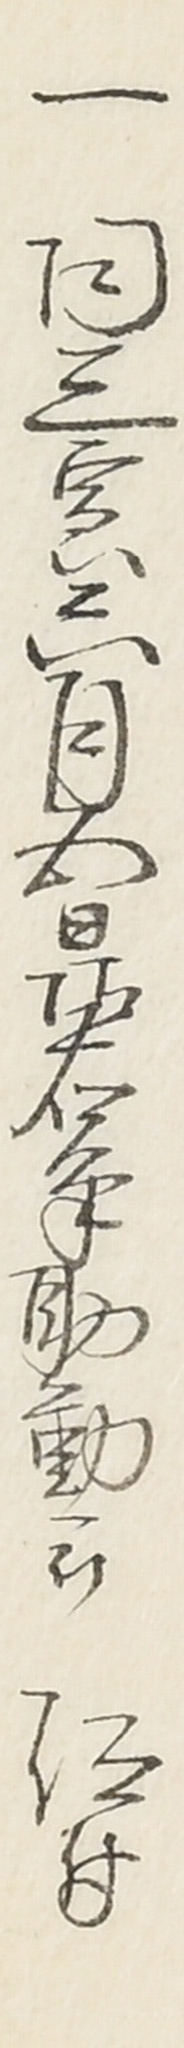一同三寅六月五日御右筆助勤被仰付
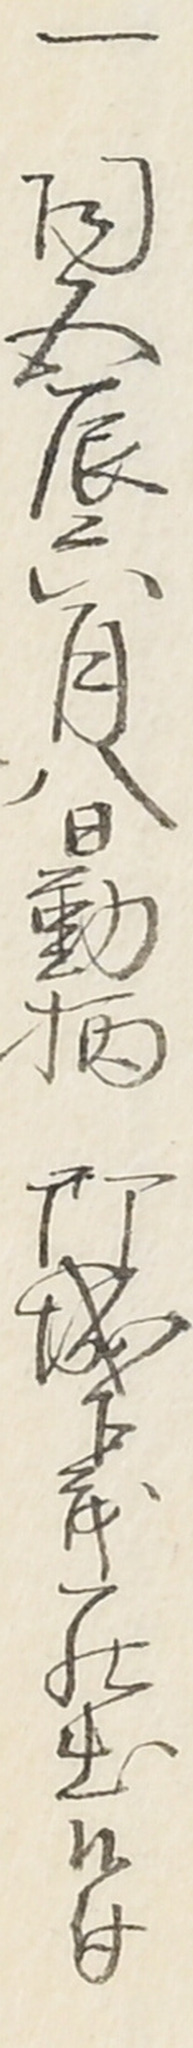一同五辰六月八日勤柄御城下茂罷出候付
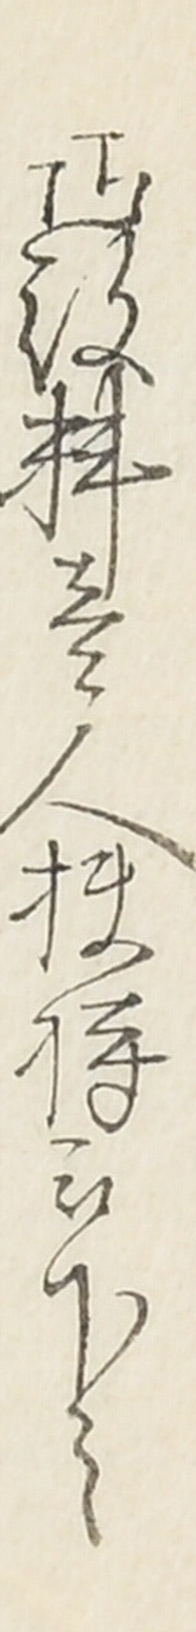御役料壱人扶持被下之
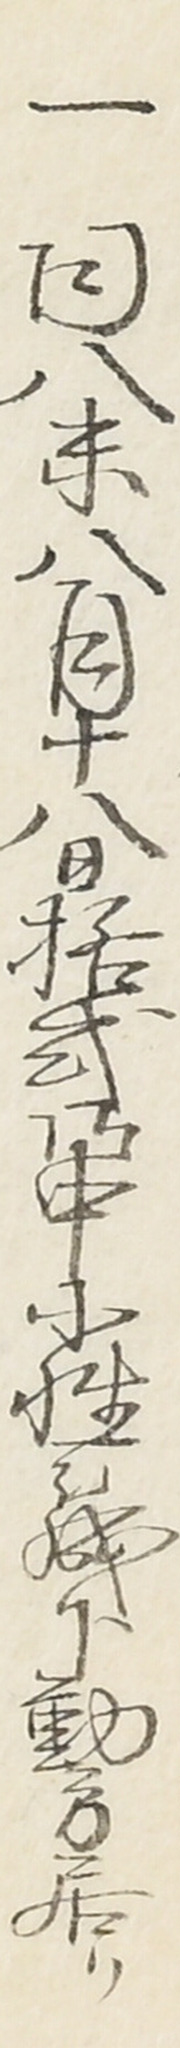一同八未八月十八日格式御中小性被成下勤方居ㇼ
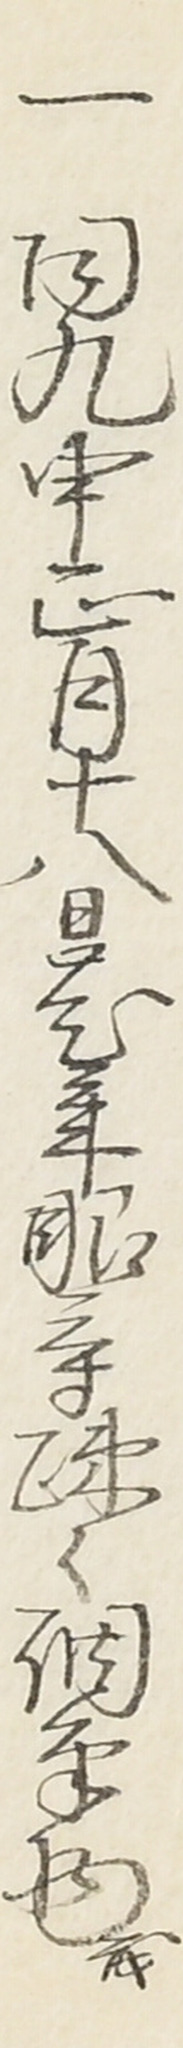一同九申正月十八日老年眼気疎く調筆物茂
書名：無足諸士勤仕録（四）
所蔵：伊那市立高遠町図書館・合同会社AMANE
